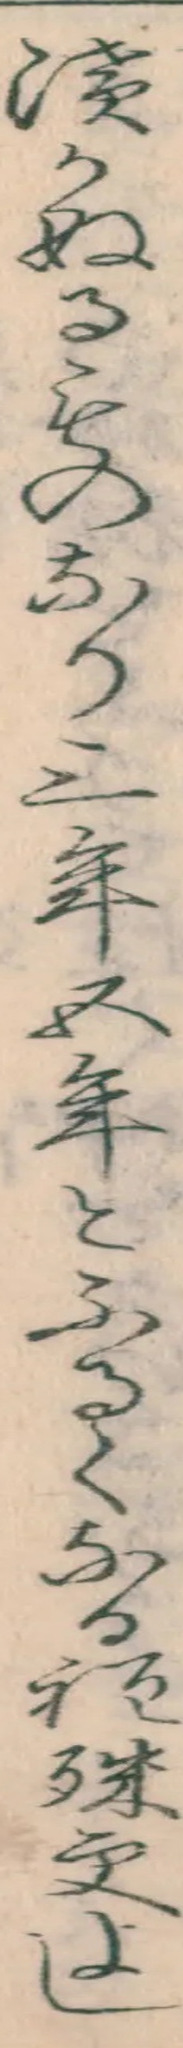漬かぬるものなり三年五年とふるくなる程殊更よし
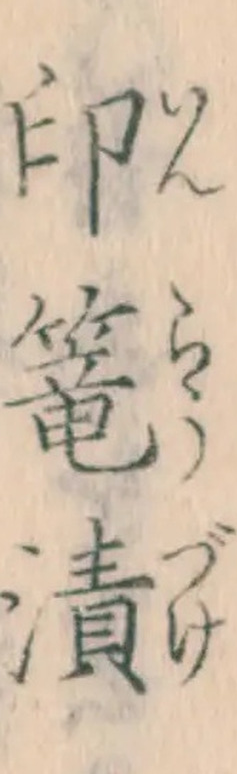印籠漬
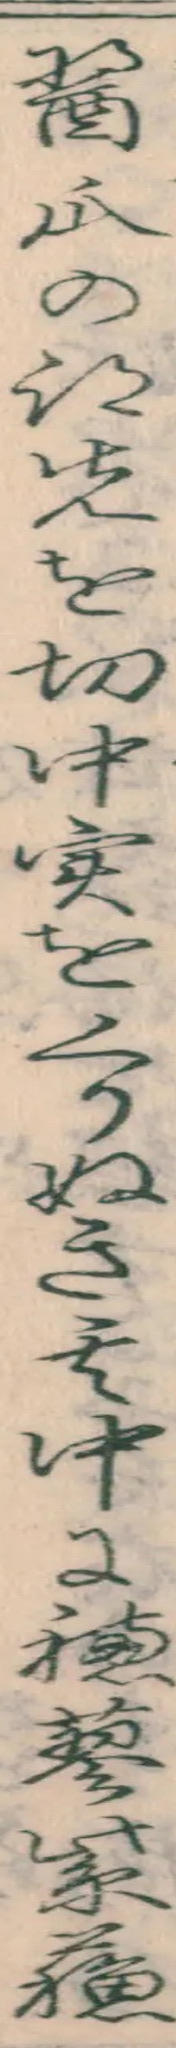醤瓜の跡先を切中実をくりぬき其中に穂蓼紫蘇
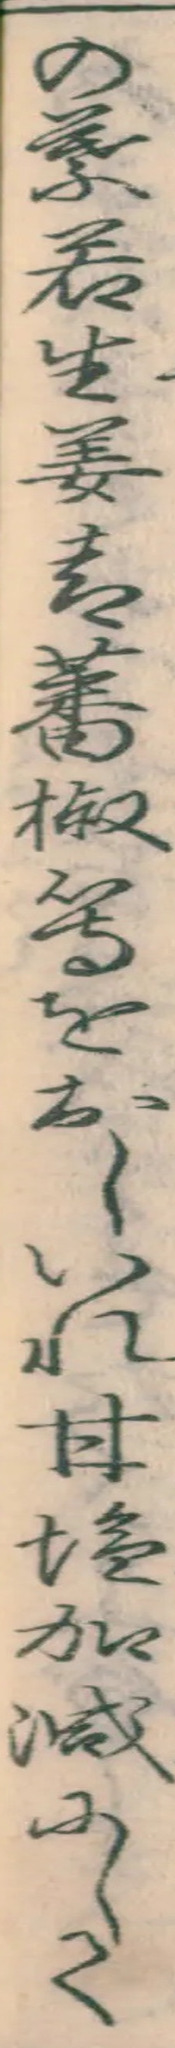の葉若生姜青蕃椒等をおしいれ甘塩加減にして
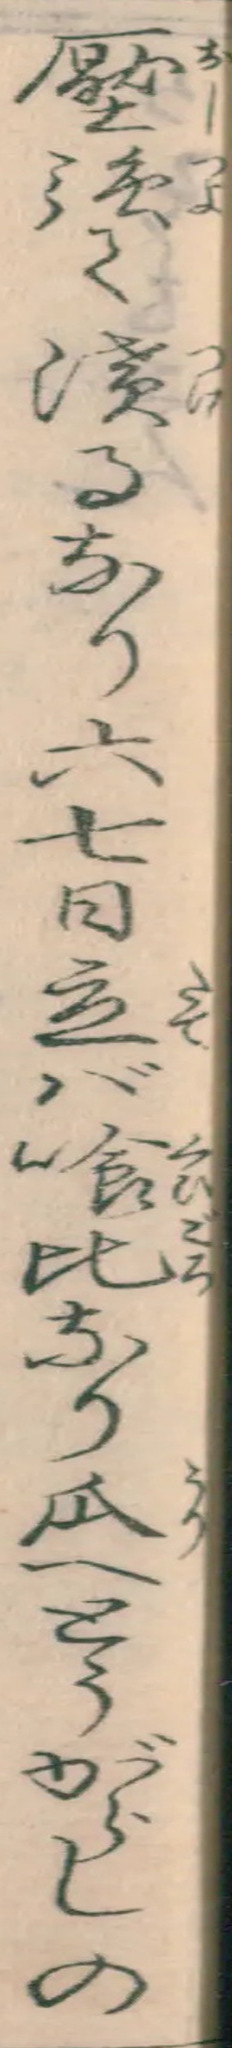圧強く漬るなり六七日立ば喰比なり瓜へとうがらしの
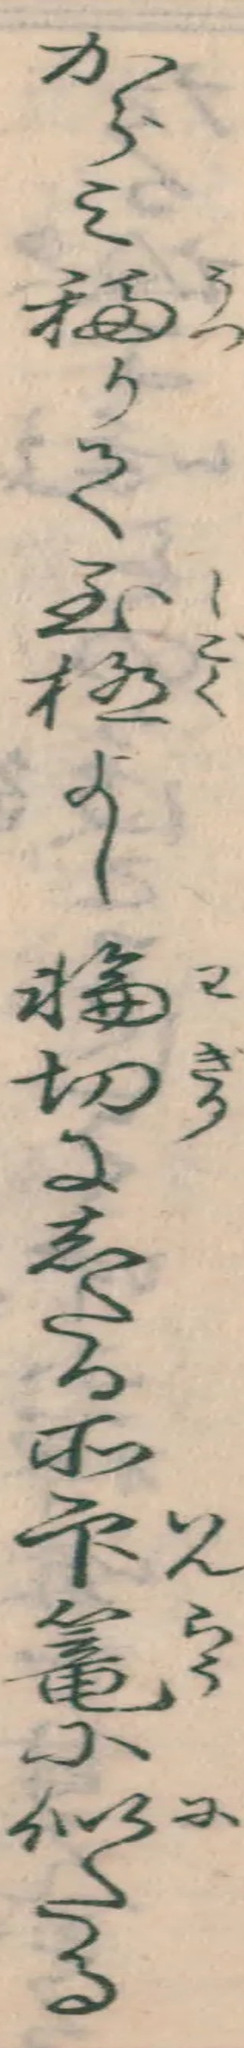からみ移りて至極よし輪切にしたる所印籠に似たる
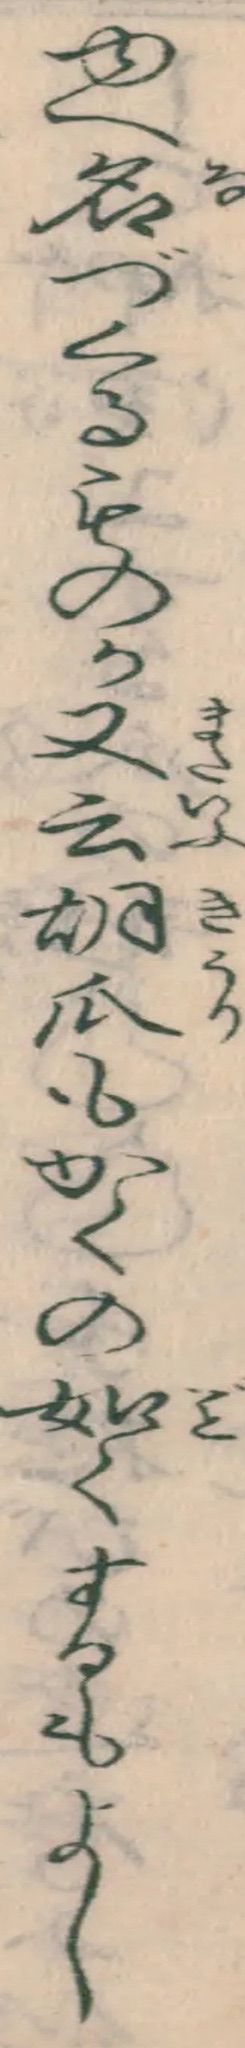ゆへ名づくるものか又云胡瓜もかくの如くするもよし
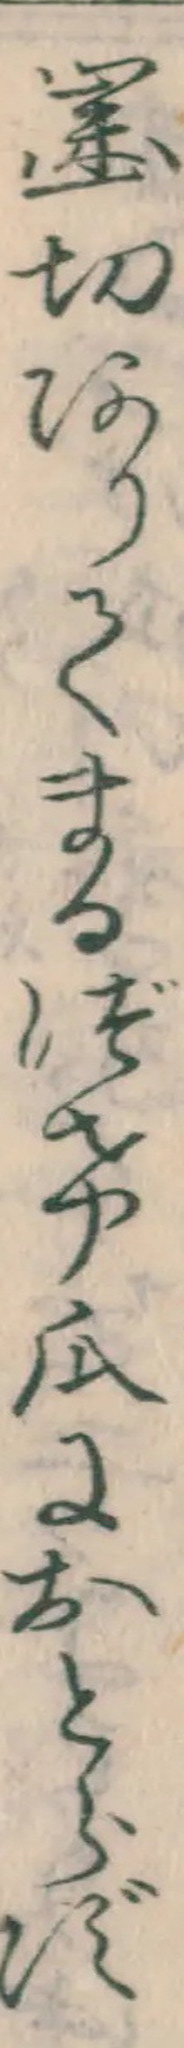歯切ありてまるづけ瓜におとらず
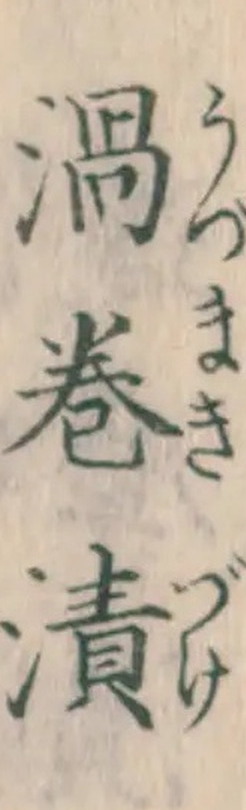渦巻漬
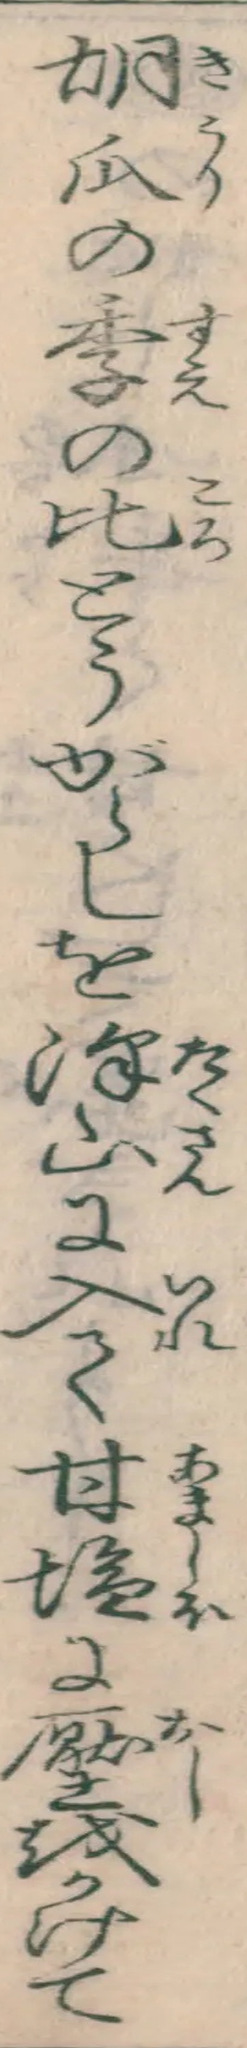胡瓜の季の比とうがらしを沢山に入て甘塩に圧をかけて
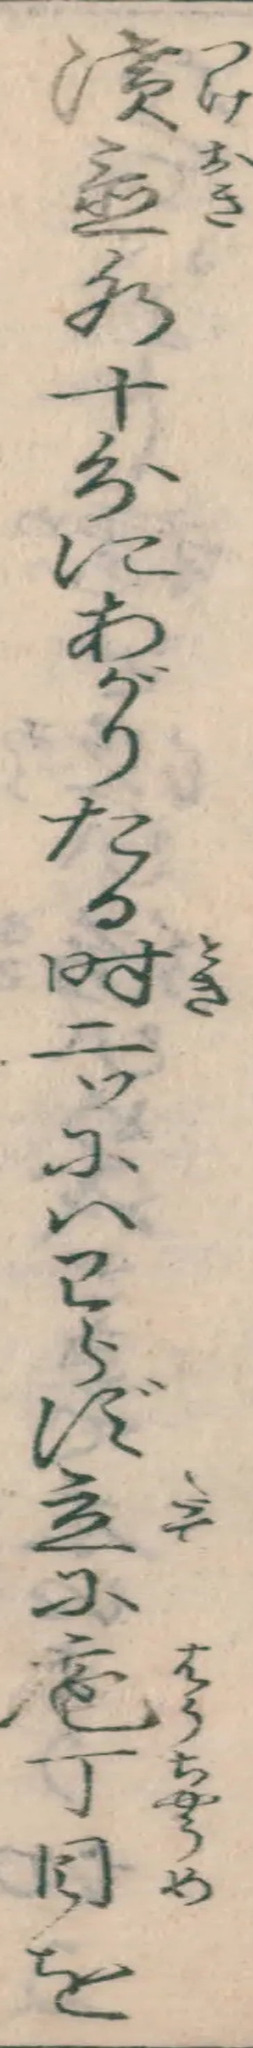漬置水十分にあがりたる時二ッにはわらず立に庖丁目を
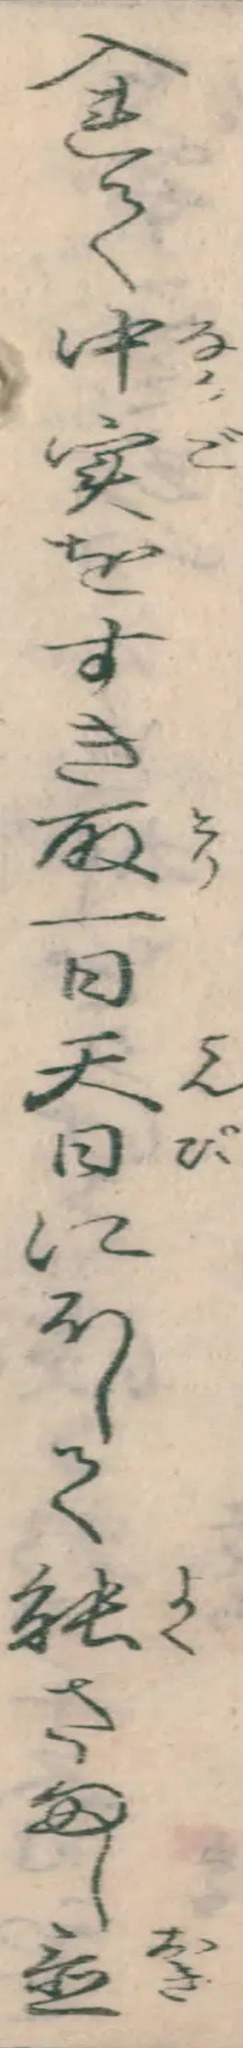入れて中実をすき取一日天日にほして能さまし置
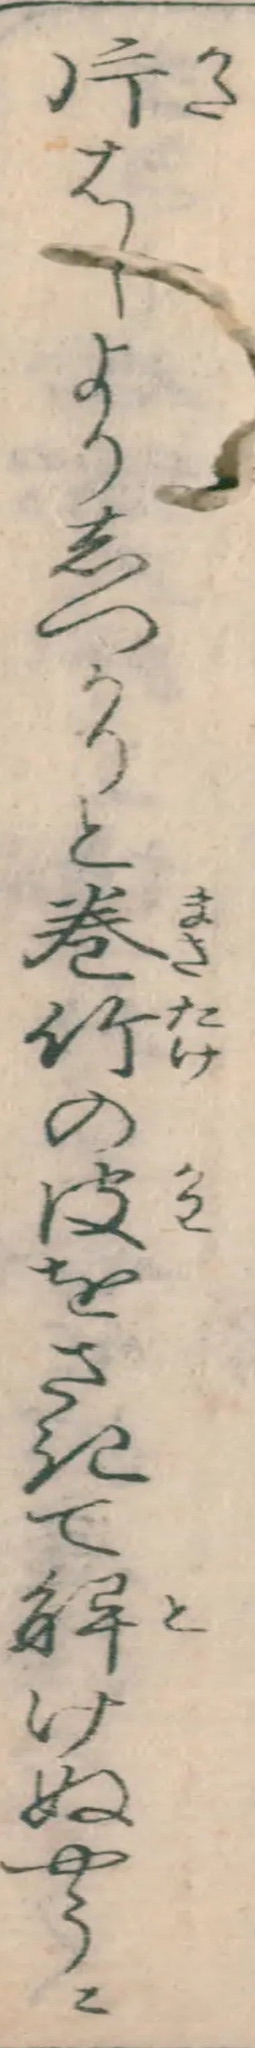片はしよりしつかりと巻竹の皮をさきて解けぬやうに

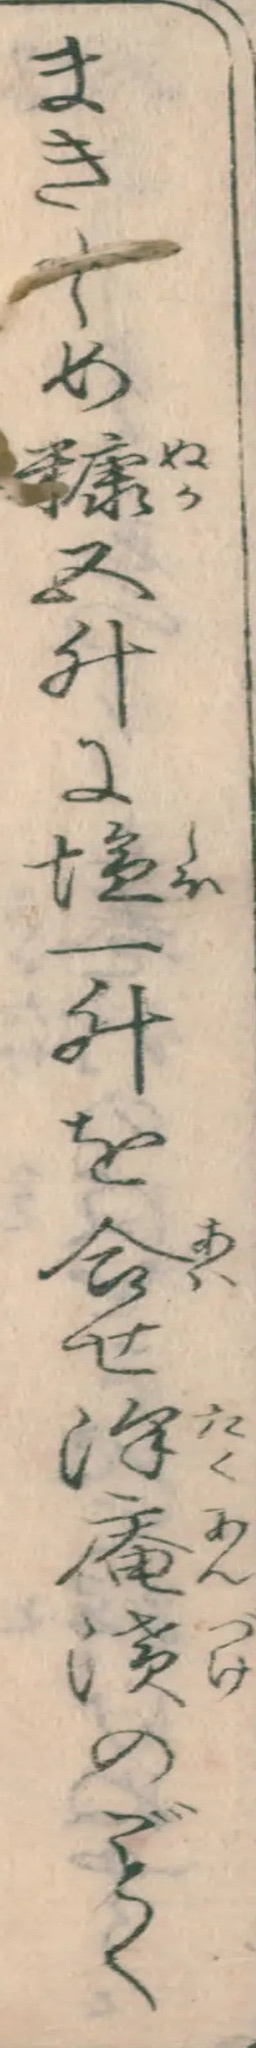まきしめ糠五升に塩一升を合せ沢庵漬のごとく
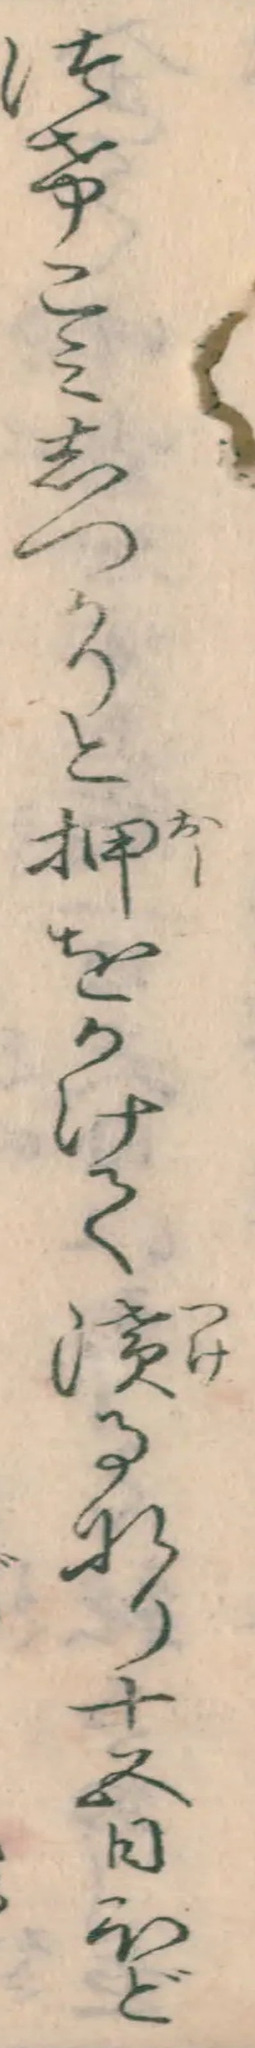つけこみしつかりと押をかけて漬るなり十五日ほど
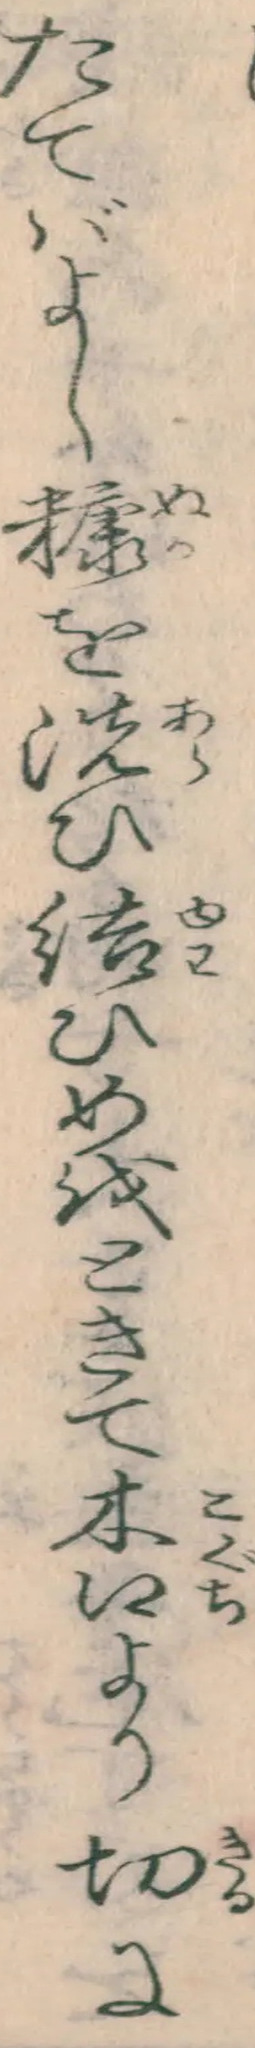たてばよし糠を洗ひ結ひめをときて木口より切に
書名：四季漬物鹽嘉言
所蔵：国立国会図書館 National Diet Library, JAPAN
